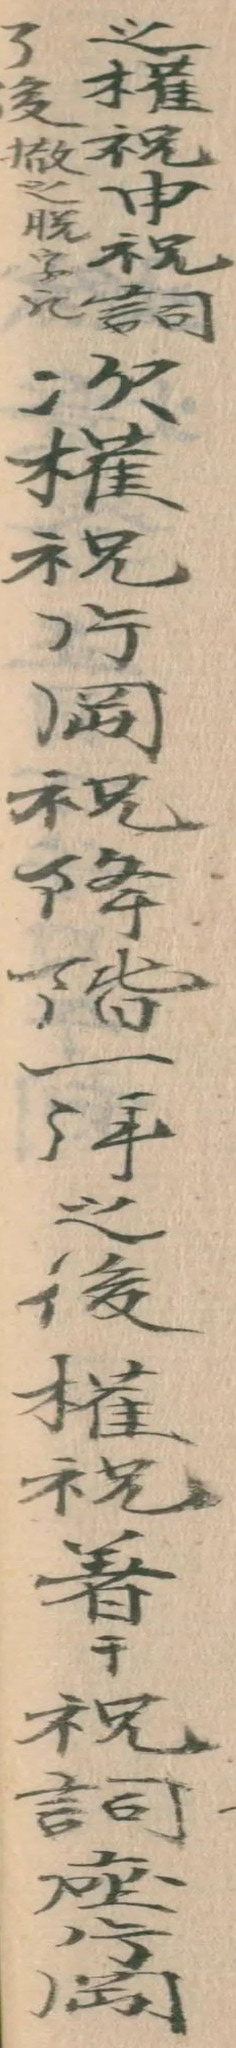之権祝申祝詞了後次権祝片岡祝降階一拝之後権祝着于祝詞座片岡
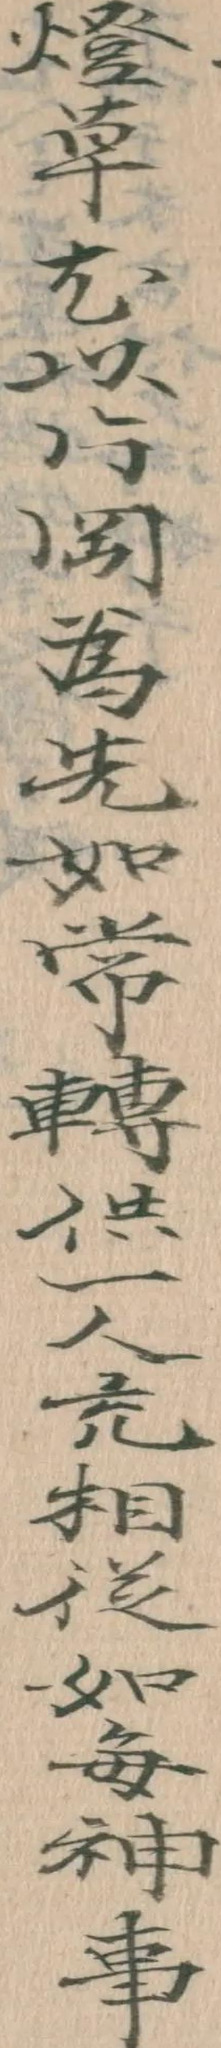燈草尤以片岡為先如常転供一人充相従如毎神事
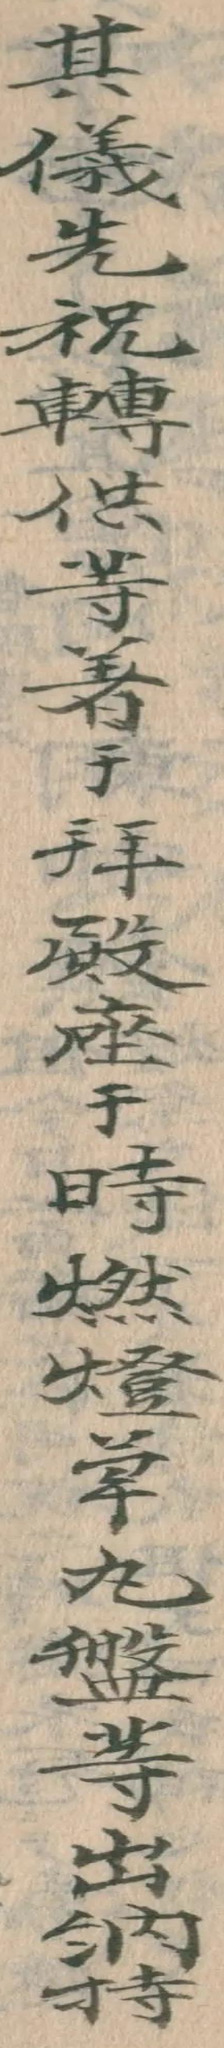其儀先祝転供等着于拝殿座于時燃燈草丸盤等出納持
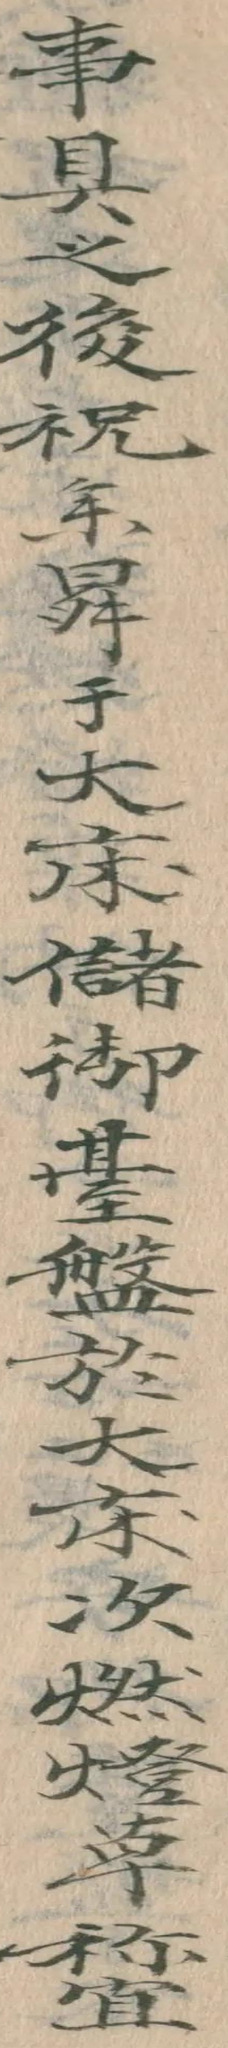事具之後祝参昇于大床儲御台盤於大床次燃煙草祢宜
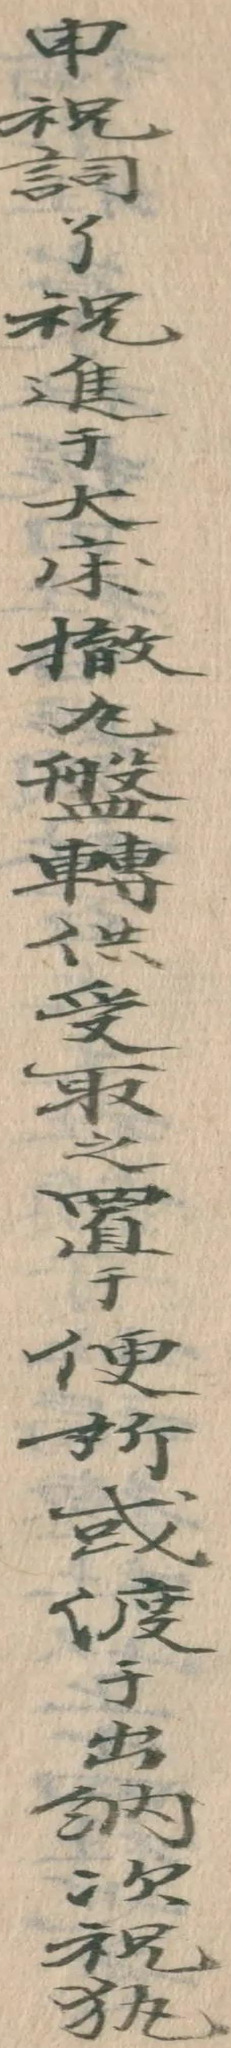申祝詞了祝進于大床撤丸盤転供受取之置于便所或渡于出納次祝執
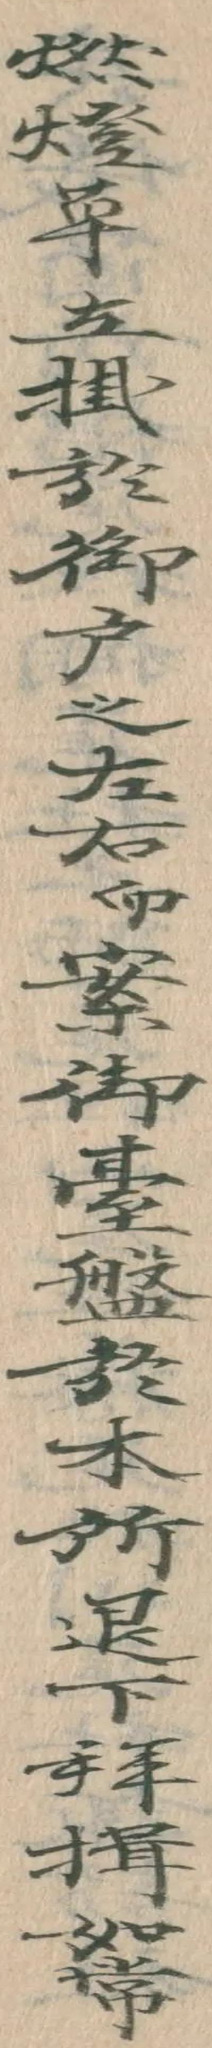燃燈草立掛於御戸之左右而案御台盤於本所退下拝揖如常
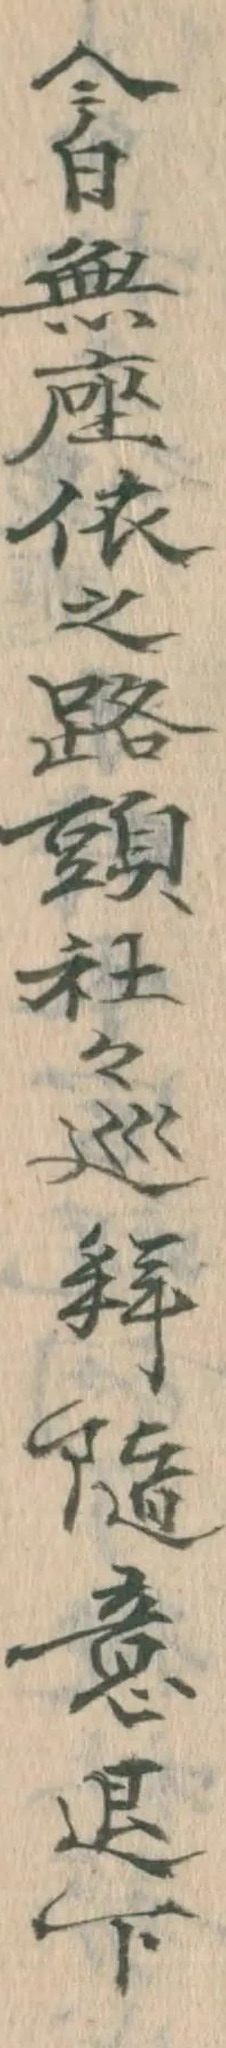今日無座依之路頭社々巡拝随意退下
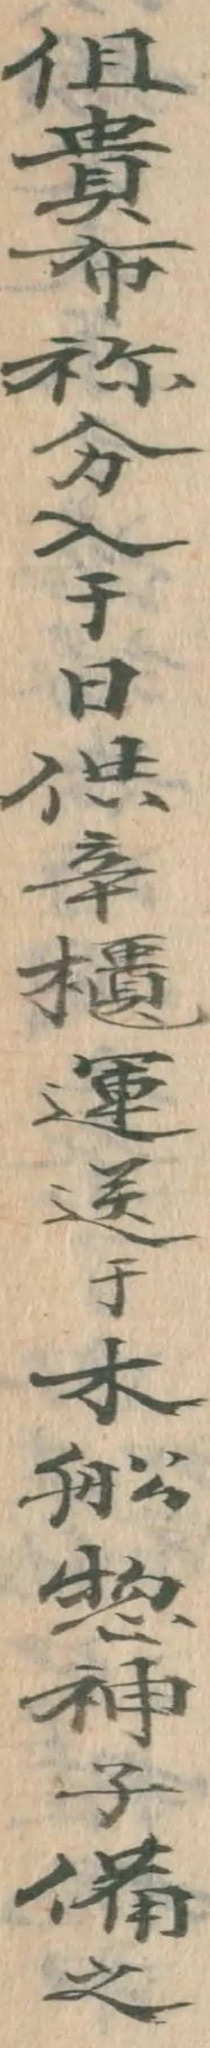但貴ふね分入于日供辛櫃運送于木船惣神子備之

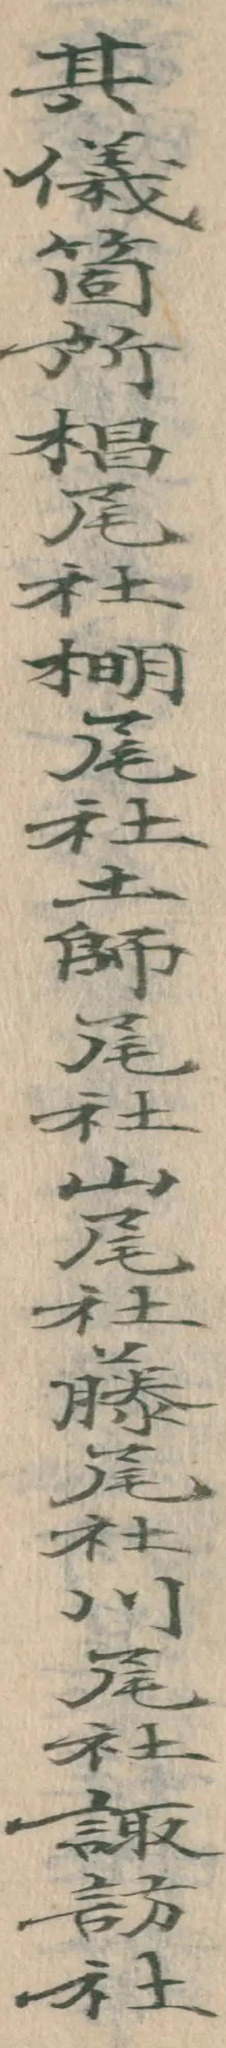其儀箇所椙尾杜棚尾社土師尾社山尾社藤尾社川尾社諏訪社
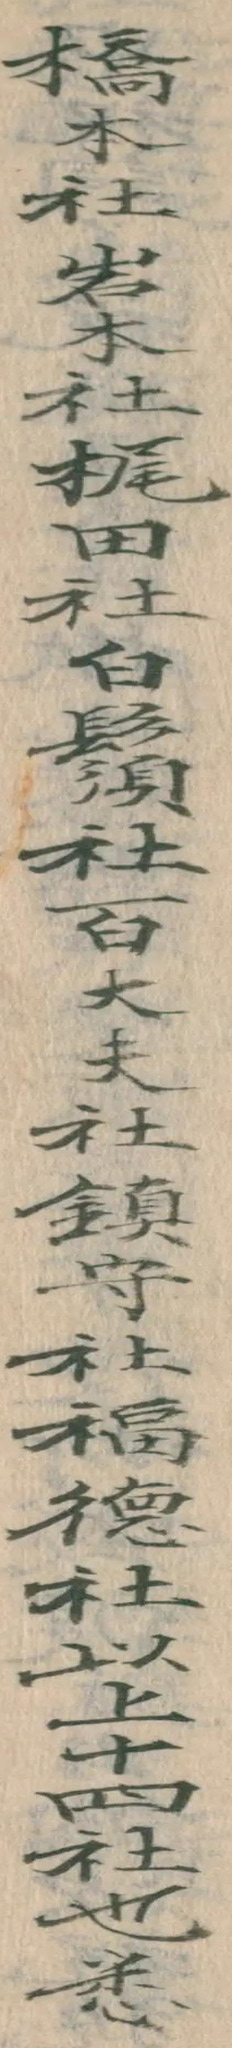橋本社岩本社梶田社白鬚社百大夫社鎮守社福徳社以上十四社也悉
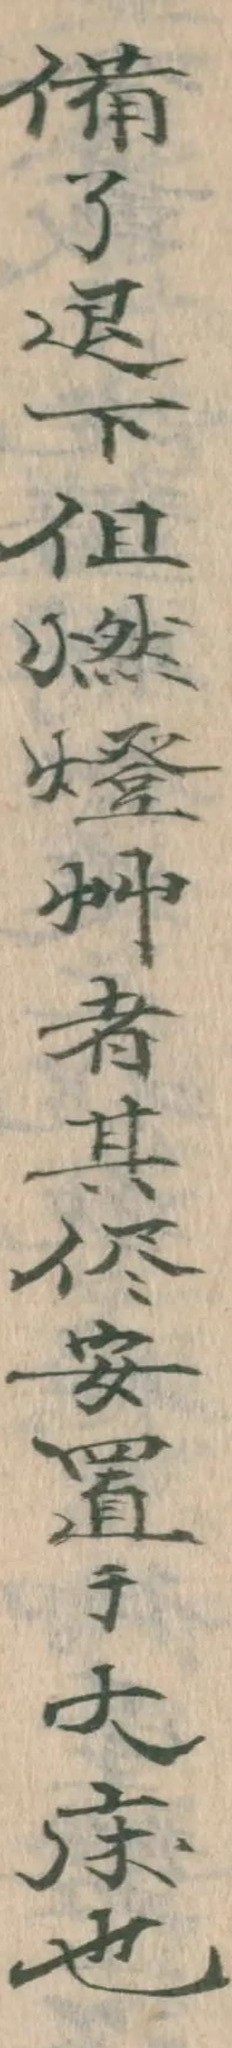備了退下但燃燈草者其侭安置于大床也
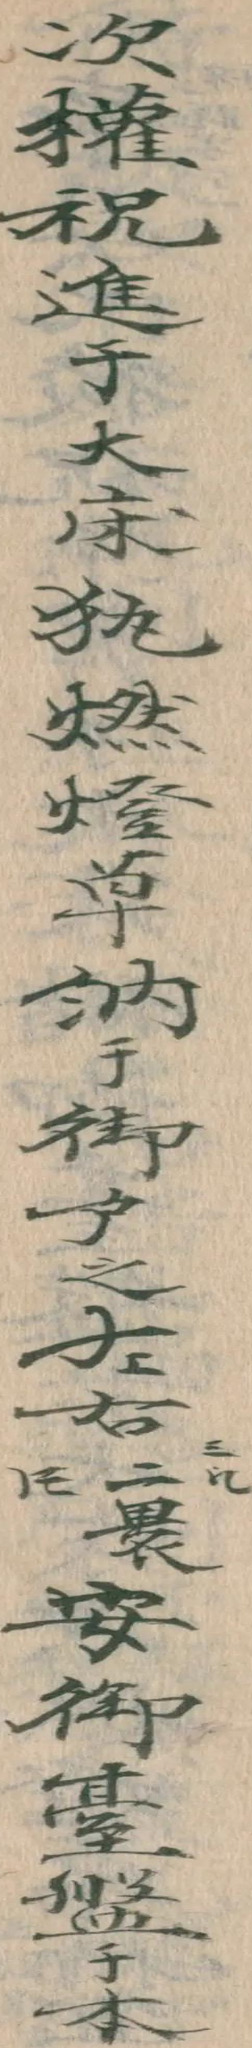次權祝進于大床執燃燈草納于御戸之左右二裹トモ安御台盤于本
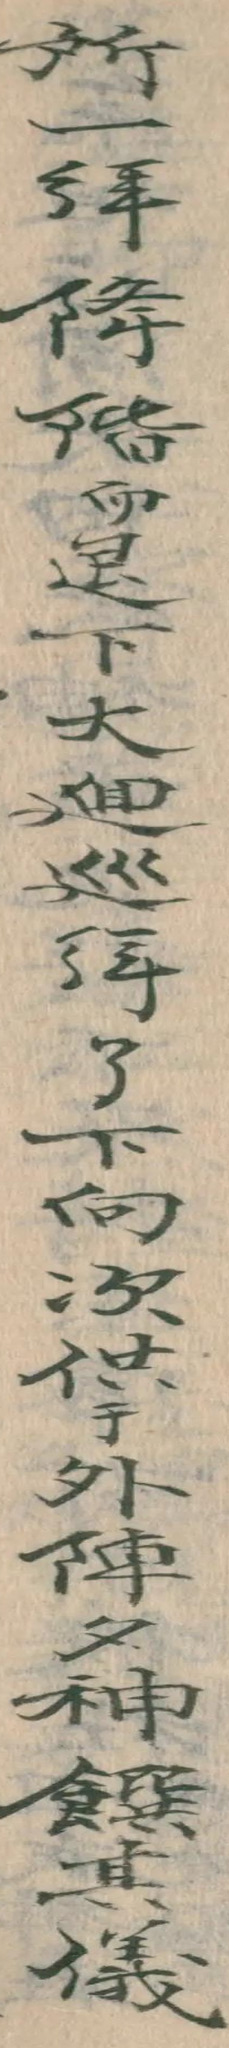所一拝降階而退下大廻巡拝了下向次供于外陣夕神饌其儀
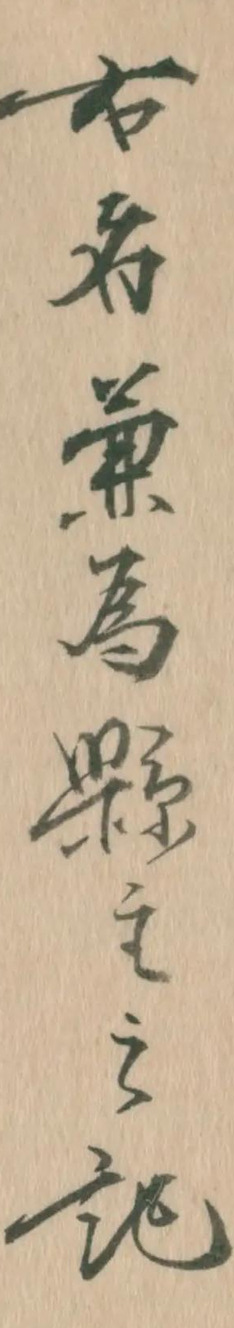右者兼為県主之記
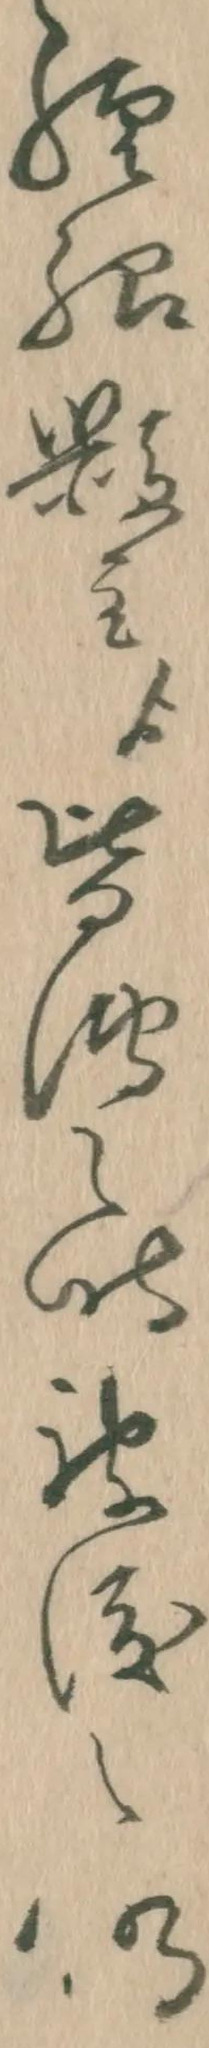経紹県主ゟ皆伝之時被渡之仍
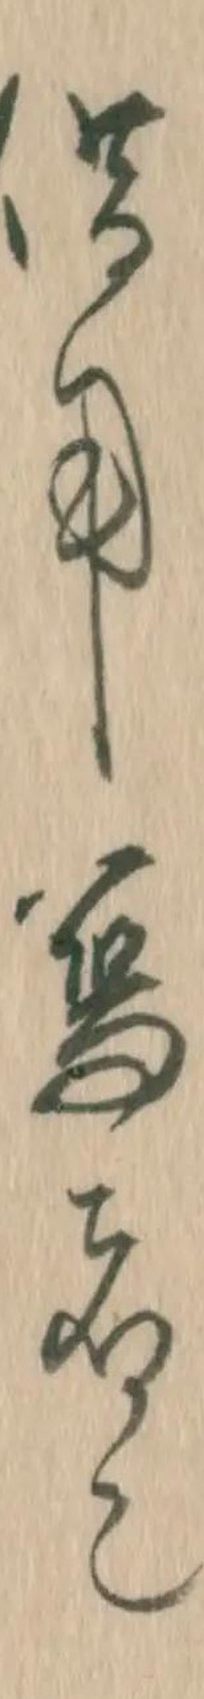借用写者也
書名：賀茂社記録. 第9冊
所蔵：国立国会図書館 National Diet Library, JAPAN
